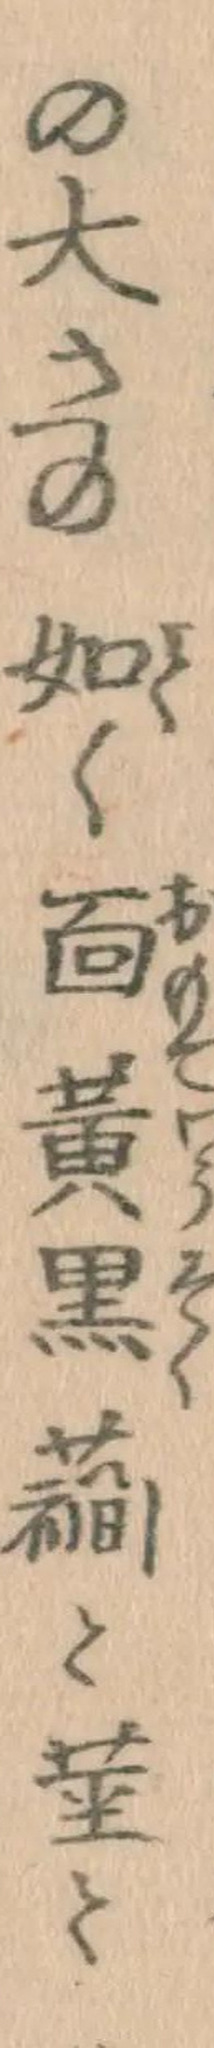の大さの如く面黄黒と茎と
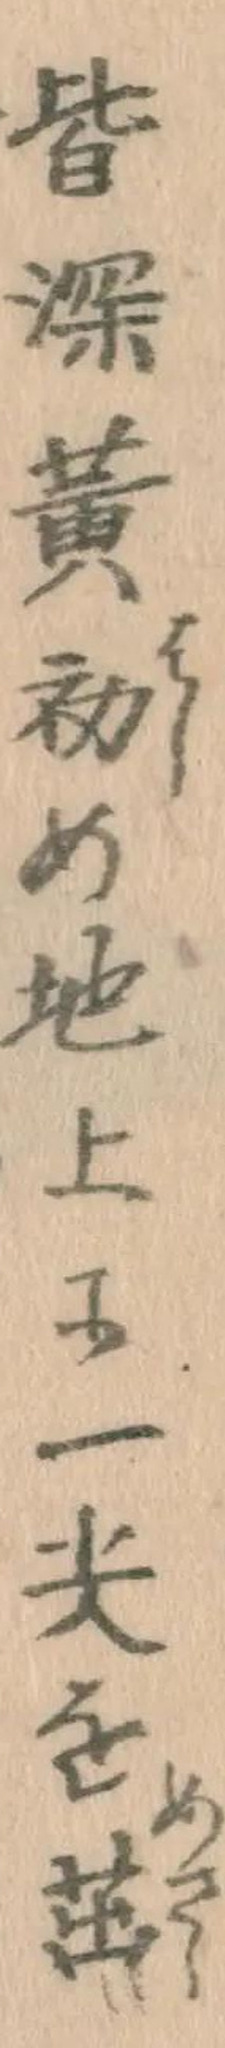皆深黄初め地上に一尖を茁
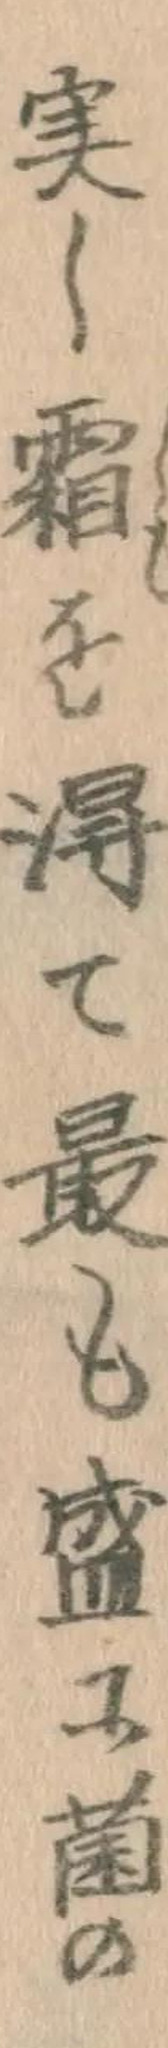実し霜を淂て最も盛に菌の
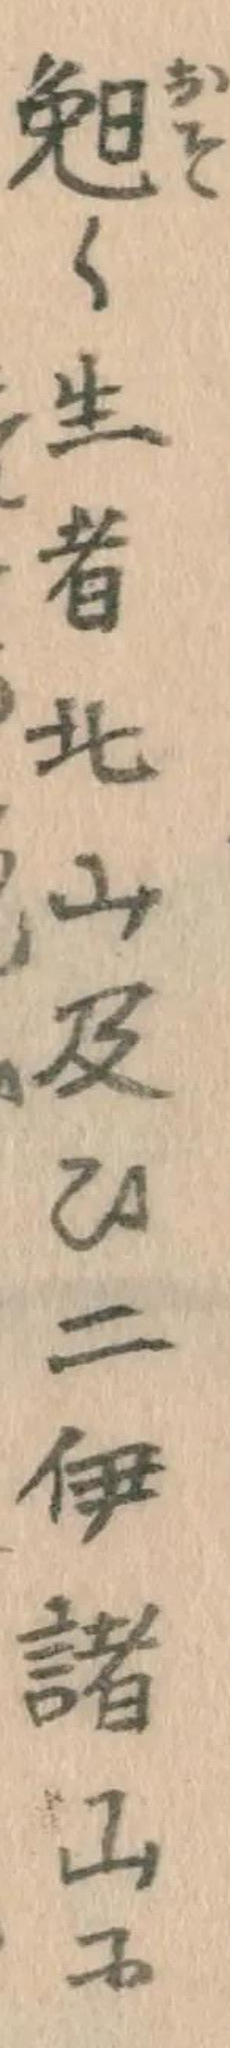晩く生者北山及ひ二伊諸山に
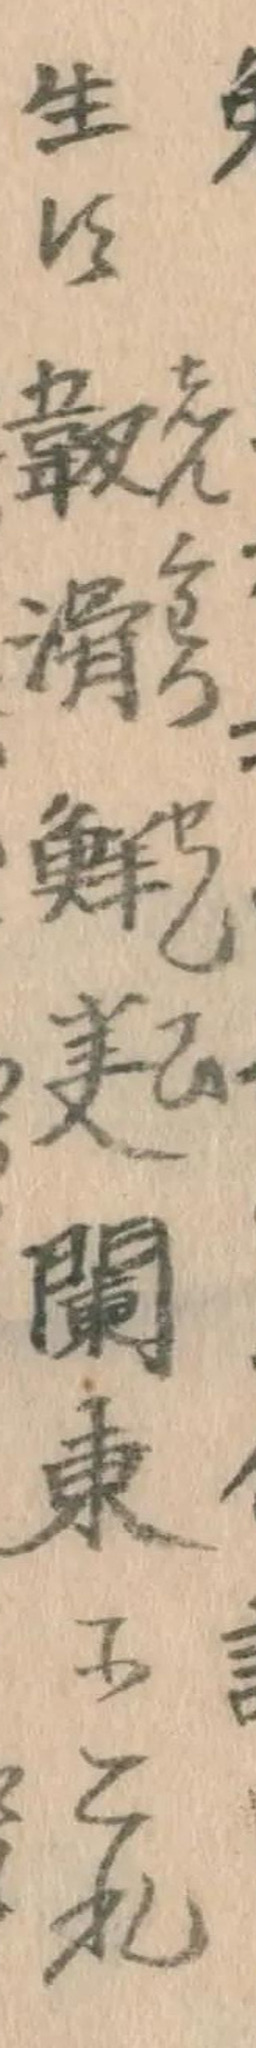生す靱滑鮮美関東にこれ
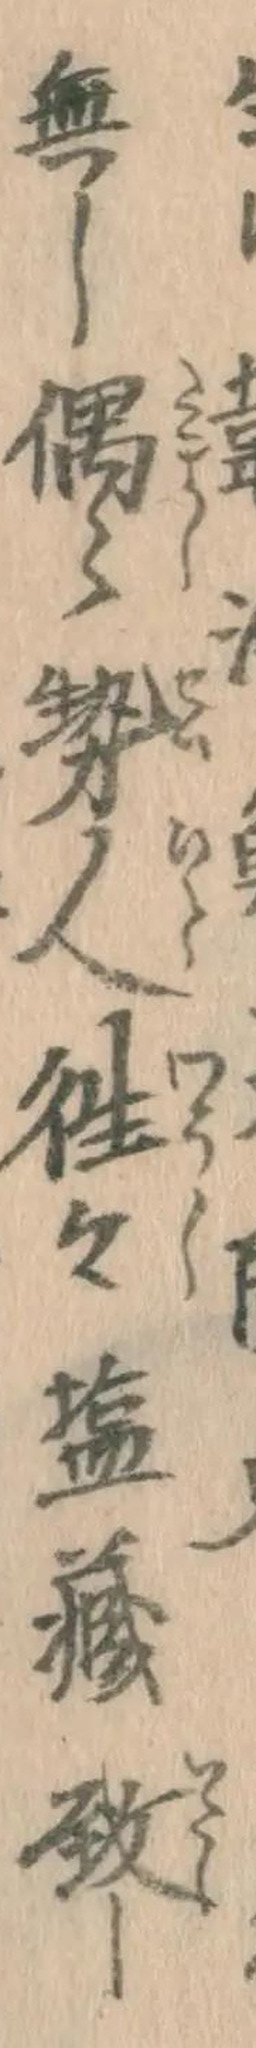無し偶々勢人往々塩蔵致し
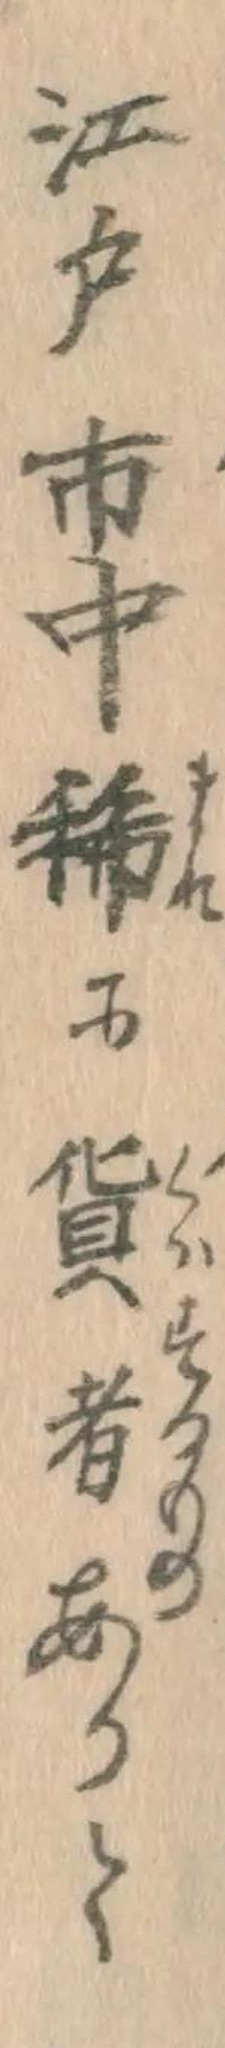江戸市中稀に貨者ありと
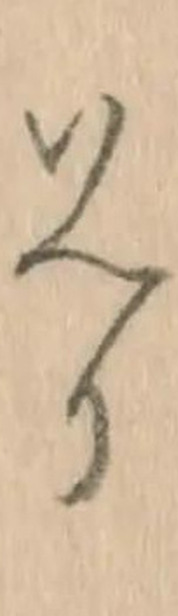いへり

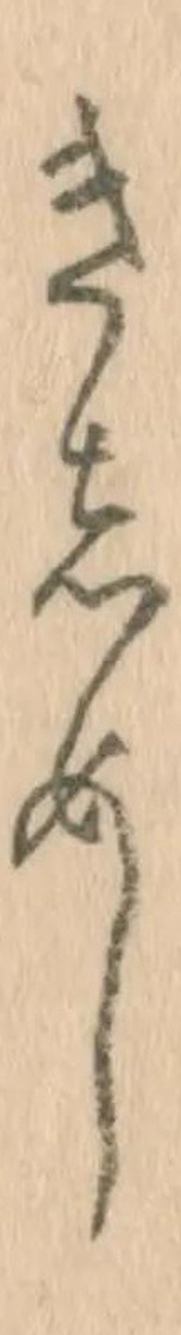きしめし
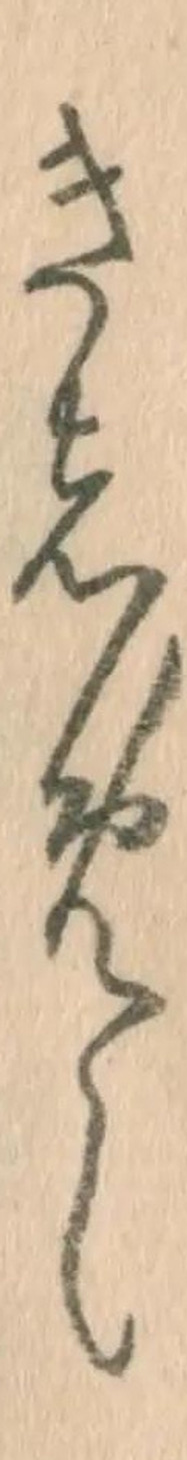きしめし
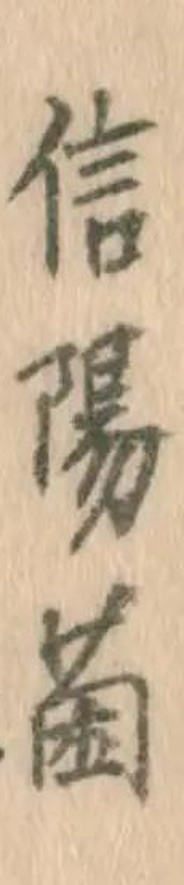信陽菌
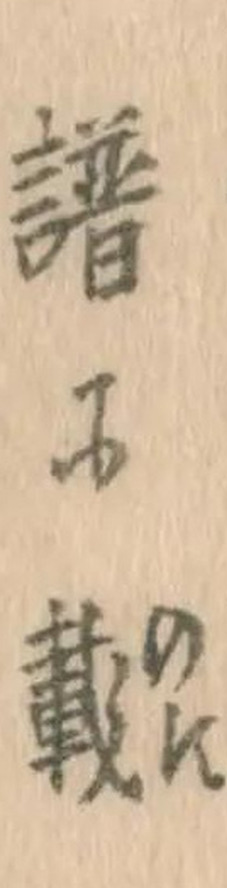譜に載
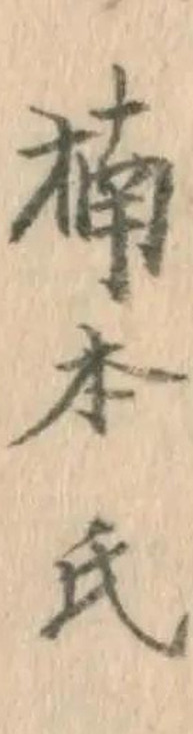楠本氏
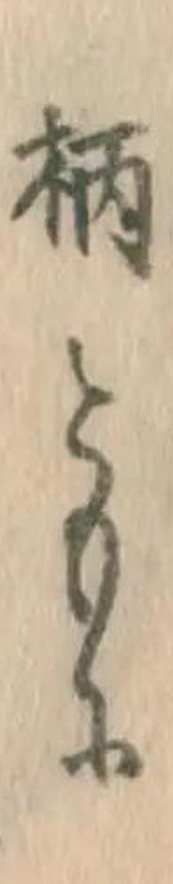柄ともに
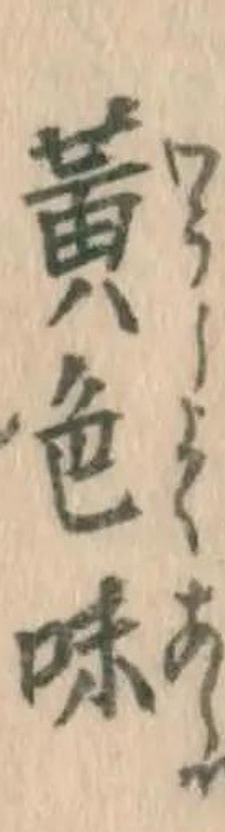黄色味
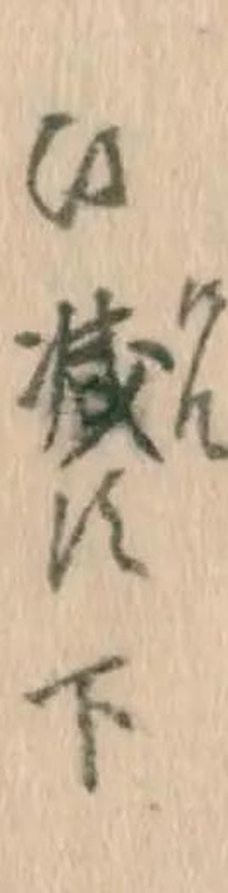ひ減す下
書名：本草図譜. 巻55-57
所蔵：国立国会図書館 National Diet Library, JAPAN
